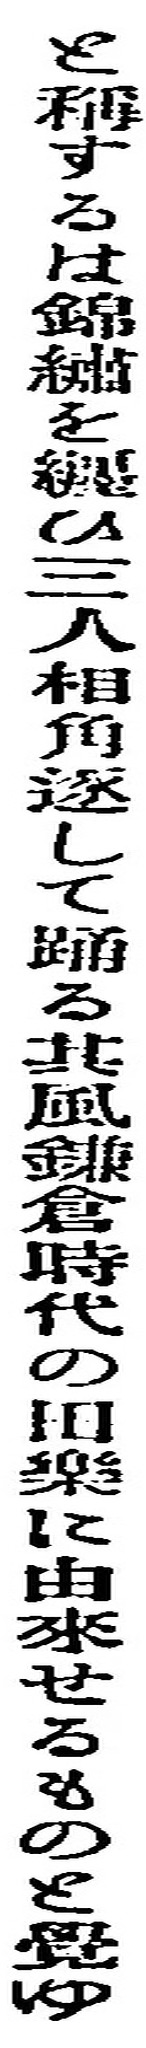と稱するは錦繡を纒ひ三人相角逐して踊る其風鎌倉時代の田樂に由來せるものと覺ゆ
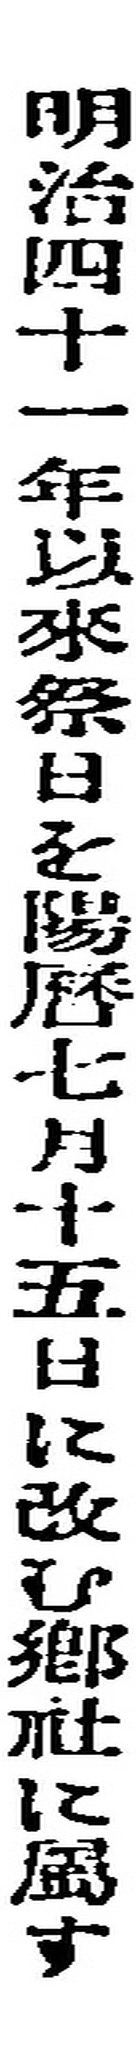明治四十一年以來祭日を陽歷七月十五日に改む鄕社に屬す
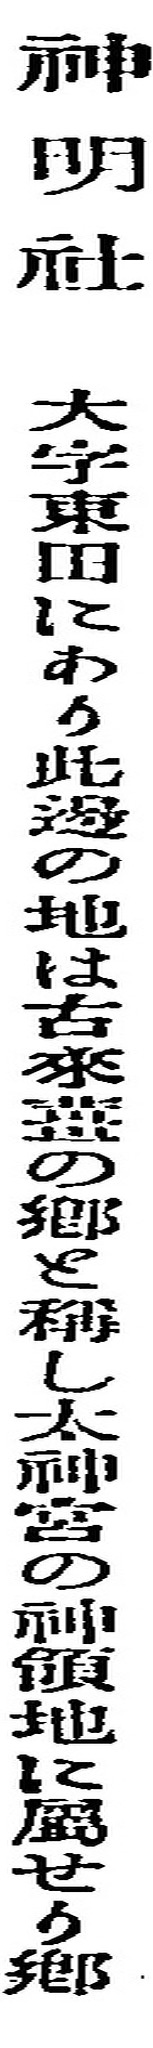神明社大字東田にあり此邊の地は古來薑の鄕と稱し太神宮の神領地に屬せり鄕
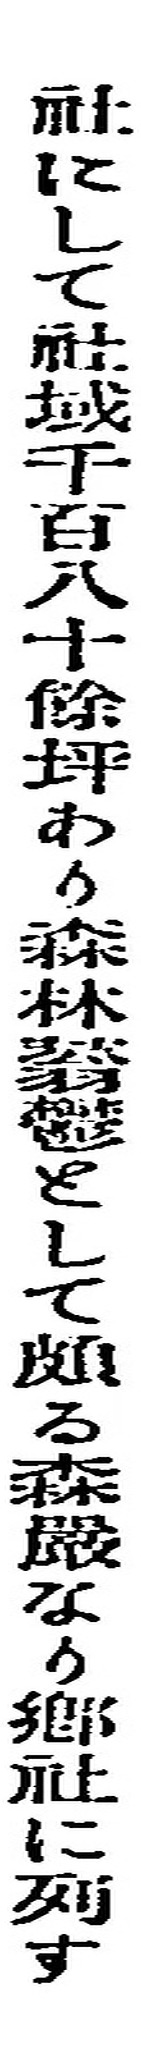社にして社域千百八十餘坪あり森林蓊鬱として頗る森嚴なり鄕社に列す
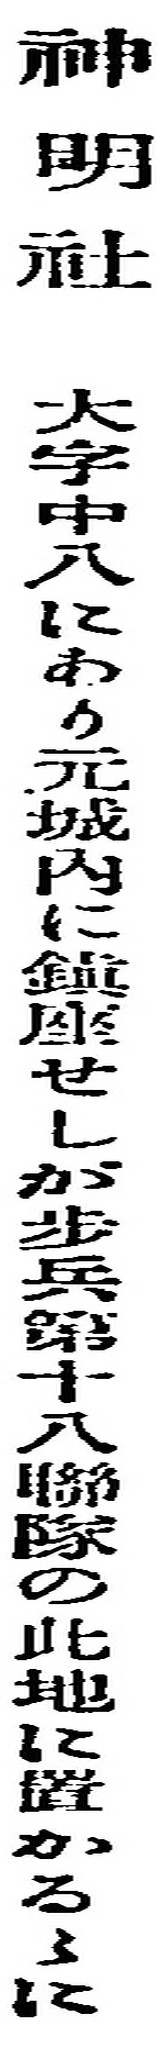神明社大字中八にあり元城内に鎭座せしが歩兵第十八聯隊の此地に置かるゝに
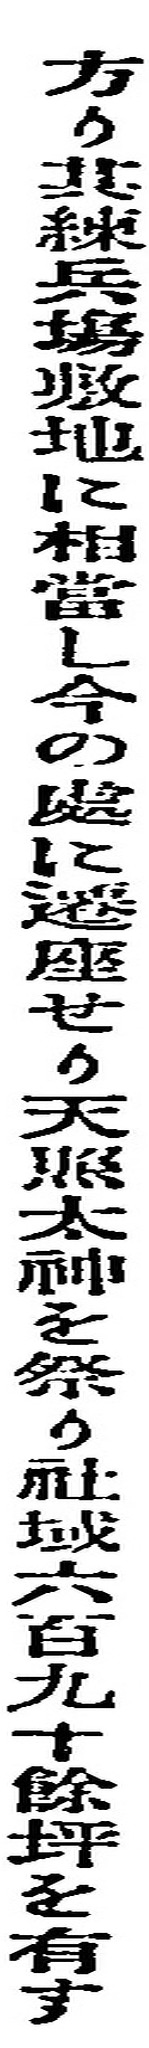方り其練兵場敷地に相當し今の處に遷座せり天照太神を祭り社域六百九十餘坪を有す
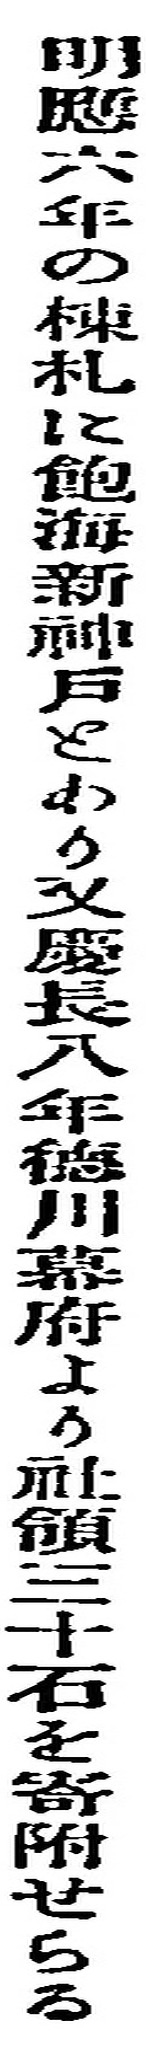明應六年の棟札に飽海新神戸とあり又慶長八年德川幕府より社領三十石を寄附せらる
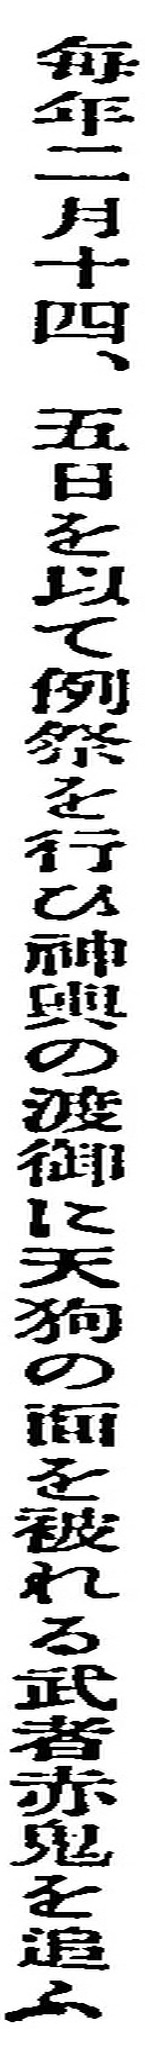每年二月十四、五日を以て例祭を行ひ神輿の渡御に天狗の面を被れる武者赤鬼を追ふ
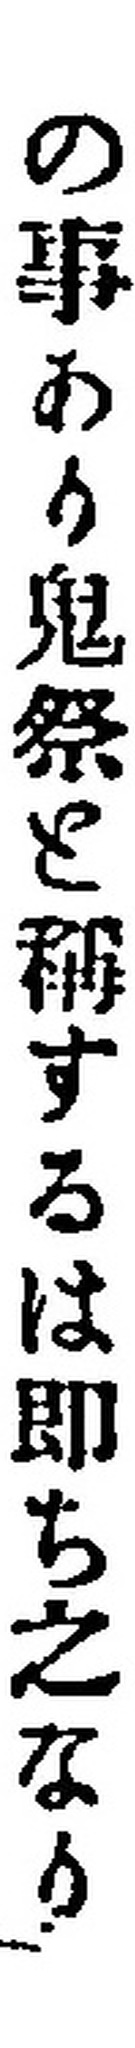の事あり鬼祭と稱するは即ち之なり
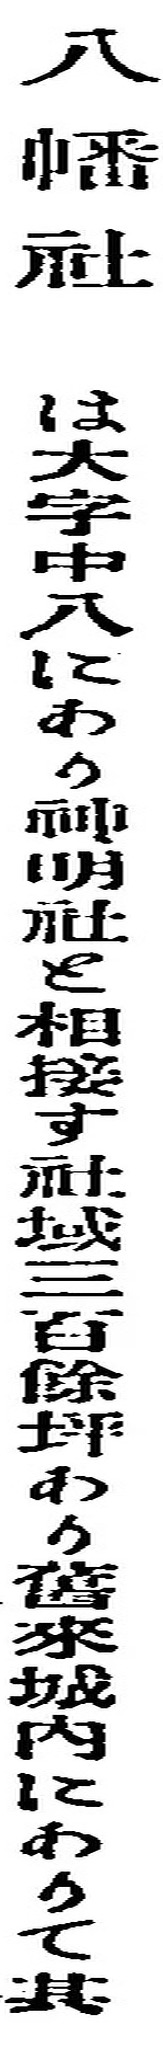八幡社は大字中八にあり神明社と相接す社域三百餘坪あり舊來城内にありて其
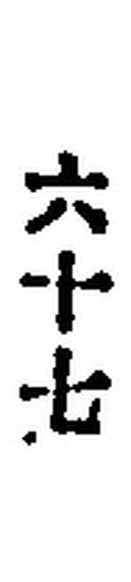六十七

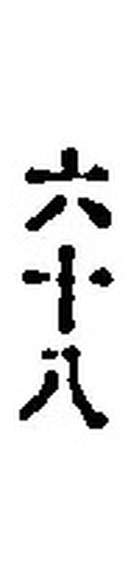六十八
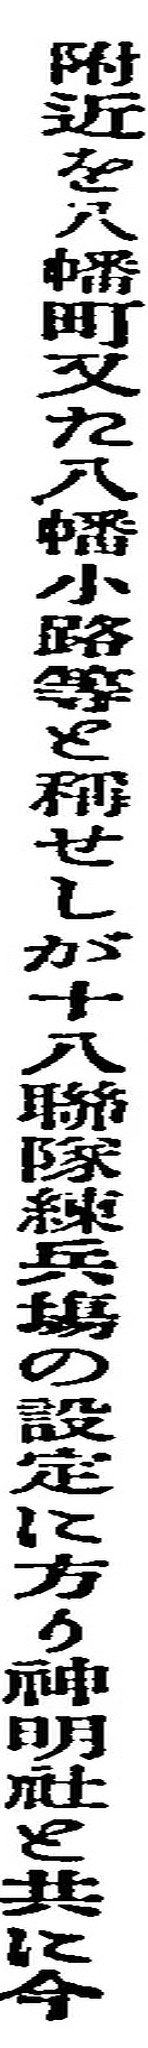附近を八幡町又た八幡小路等と稱せしが十八聯隊練兵場の設定に方り神明社と共に今
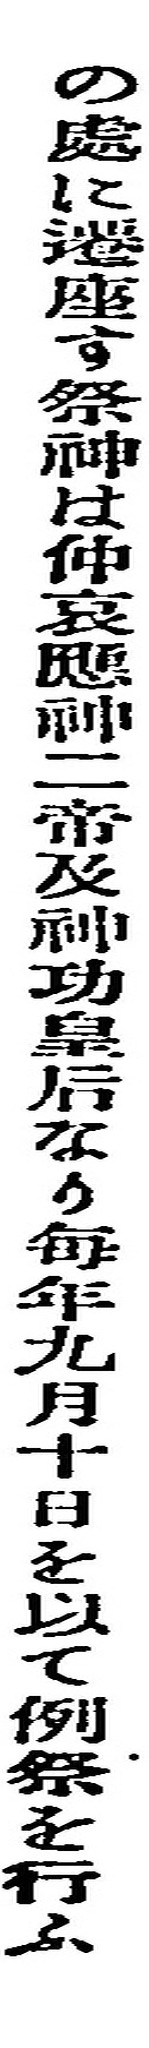の處に遷座す祭神は仲哀應神二帝及神功皇后なり每年九月十日を以て例祭を行ふ
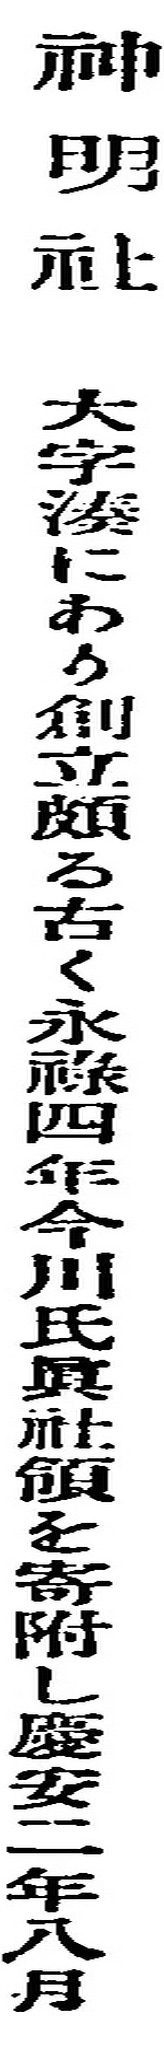神明社大字湊にあり創立頗る古く永祿四年今川氏眞社領を寄附し慶安二年八月
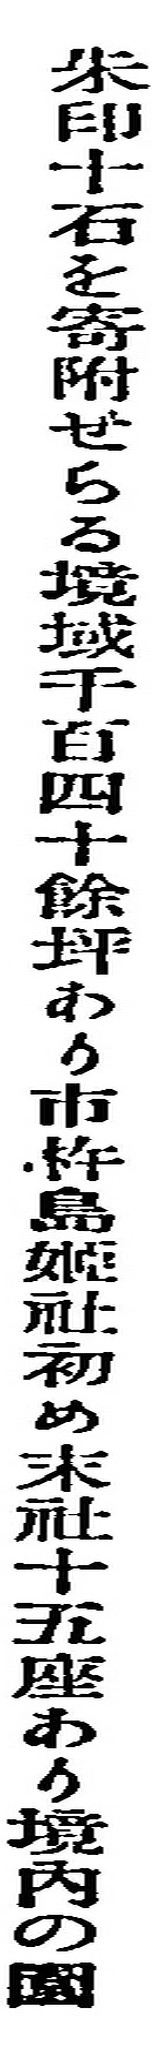朱印十石を寄附せらる境域千百四十餘坪あり市杵島姫社初め末社十五座あり境内の園
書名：豊橋志要
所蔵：国立国会図書館 National Diet Library, JAPAN
